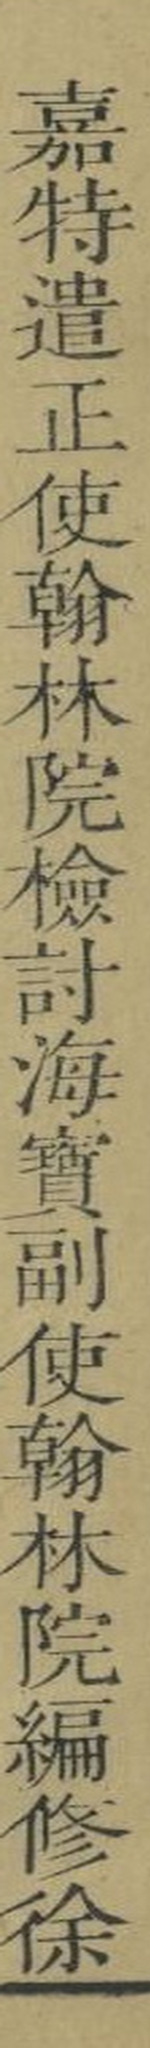嘉特遣正使翰林院檢討海寶副使翰林院編修徐
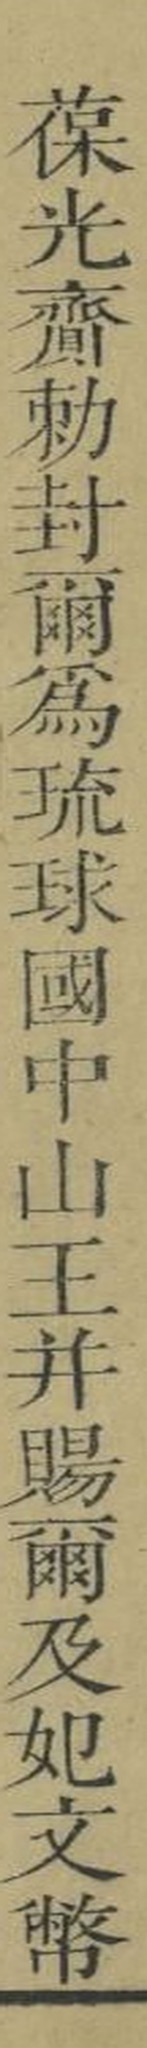葆光齎勅封爾爲琉球國中山王并賜爾及妃文幣
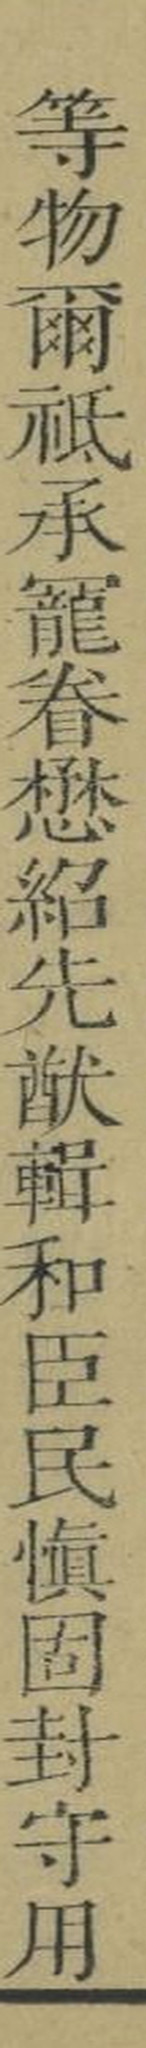等物爾祇承寵眷懋紹先猷輯和臣民愼固封守用
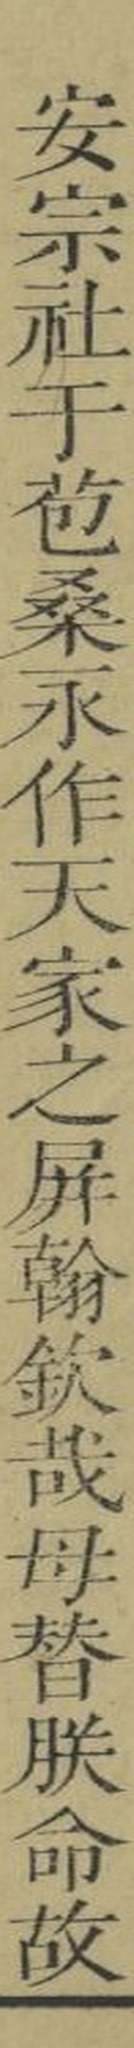安宗社于苞桑永作天家之屏翰欽哉母替朕命故
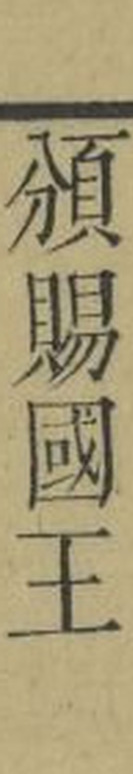領賜國王
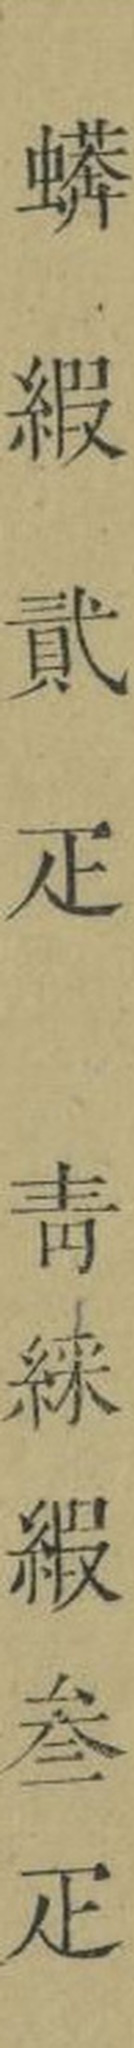蠎縀貮疋靑綵縀参疋
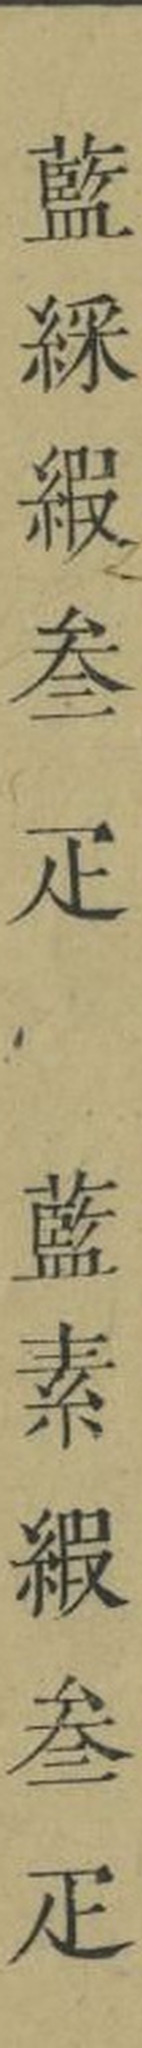藍綵縀参疋藍素縀参疋
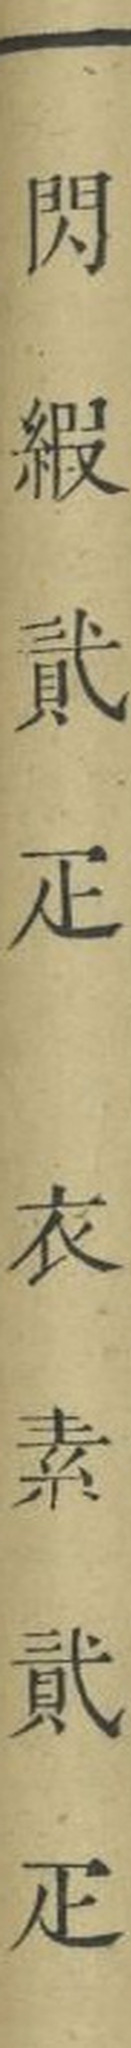閃縀貮疋衣素貮疋
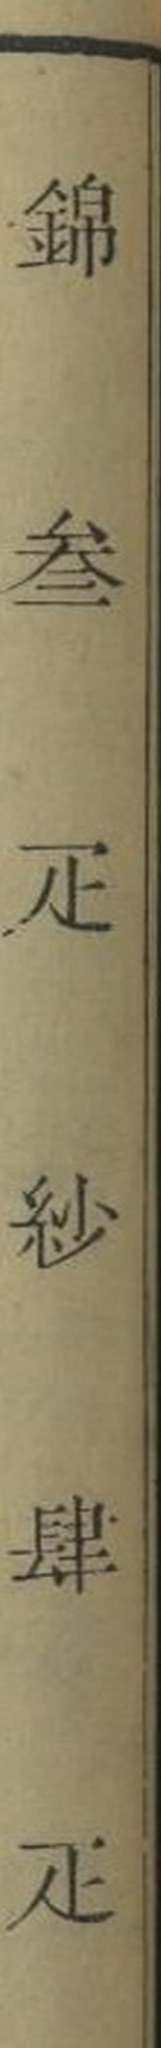錦参疋紗肆疋
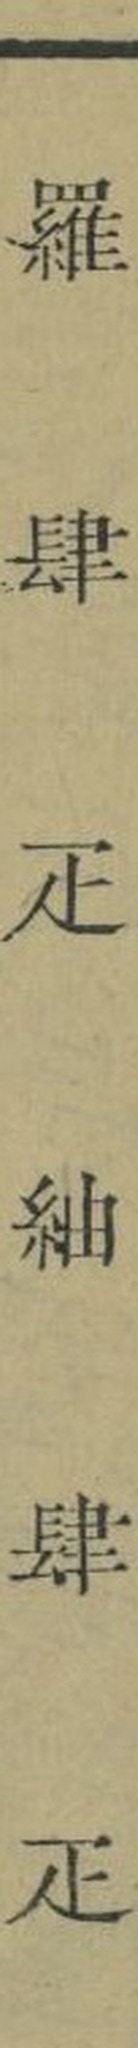羅肆疋紬肆疋
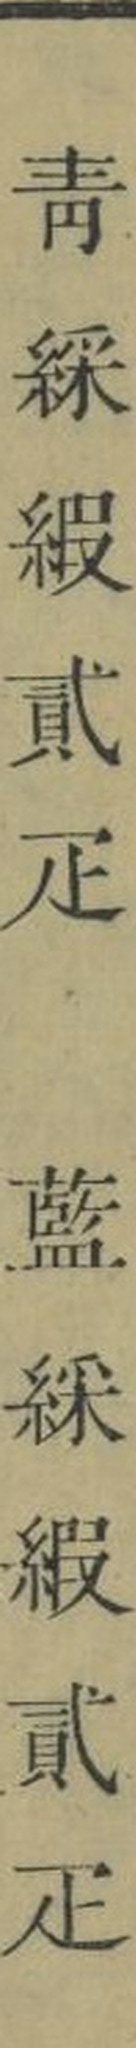靑綵縀貳疋藍綵縀貳疋
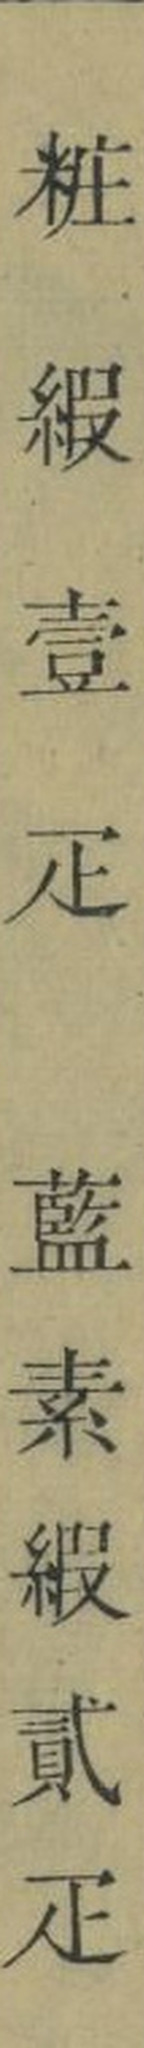粧縀壹疋藍素縀貳疋
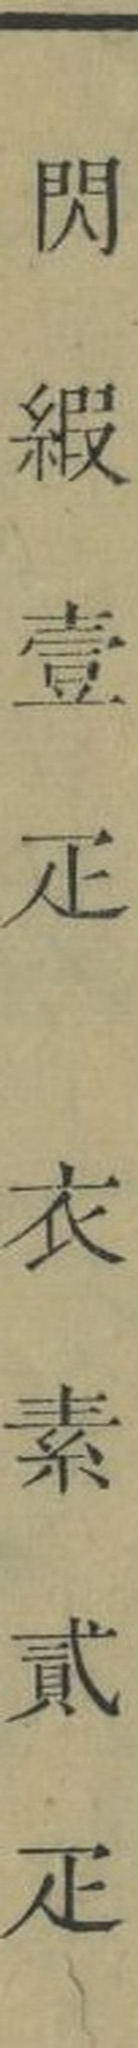閃縀壹疋衣素貳疋
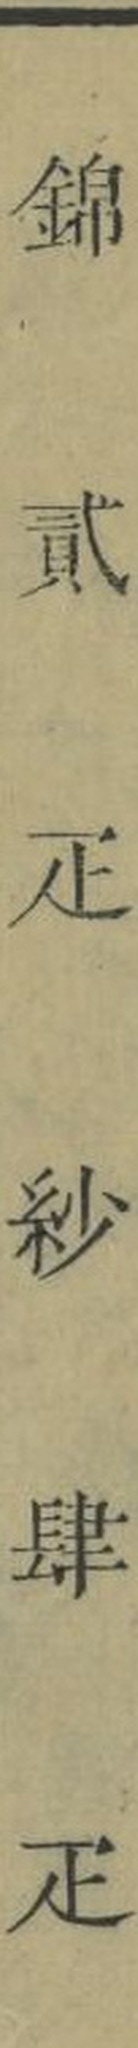錦貳疋紗肆疋
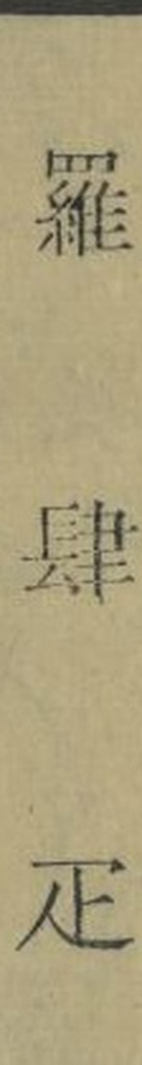羅肆疋
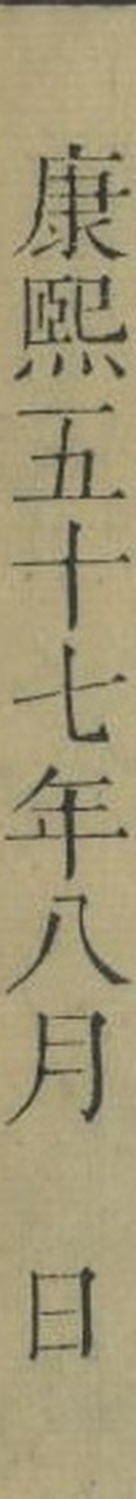康煕五十七年八月日
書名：中山伝信録 巻二
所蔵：University of the Ryukyus Library
